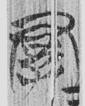君子
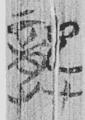龏（恭）
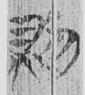則
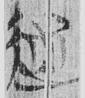述
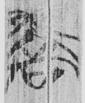喬（驕）
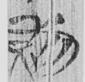則
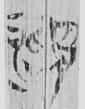○（侮）
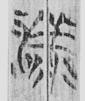{水𤰇}（備）
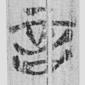言
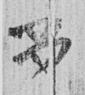多
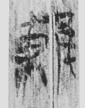難
